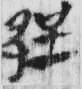郢
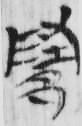○（隋）
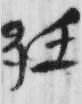邸
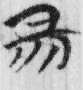昜（陽）
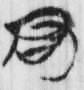君
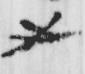之
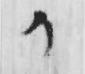人
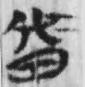番
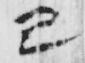己
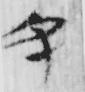丑
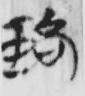珞
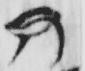尹
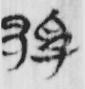郛
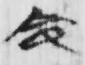○（中）
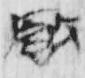○（厩）
